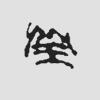閏
